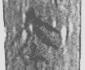六
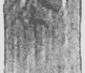十
